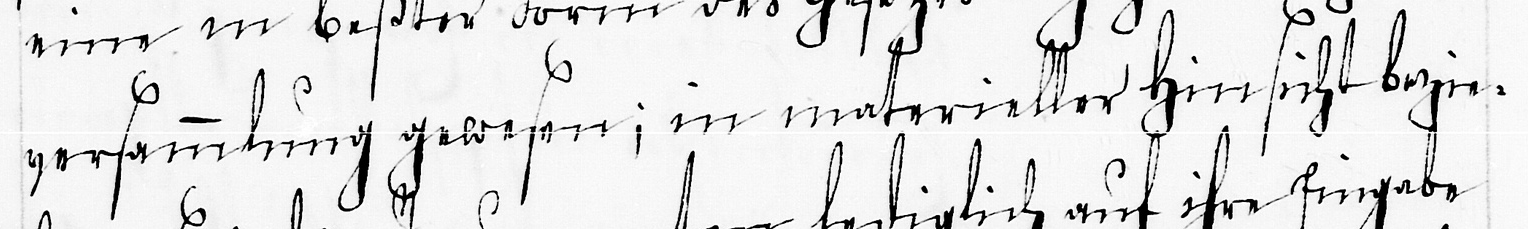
versammlung gewesen; in materieller Hinsicht bezie¬
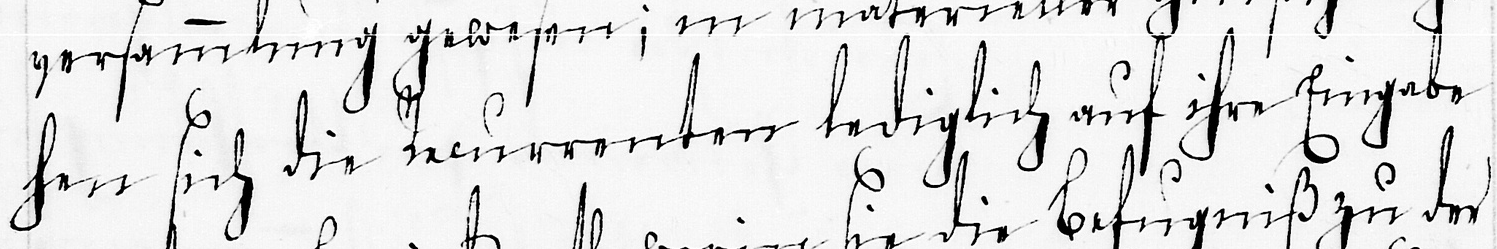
hen sich die Recurrenten lediglich auf ihre Eingabe
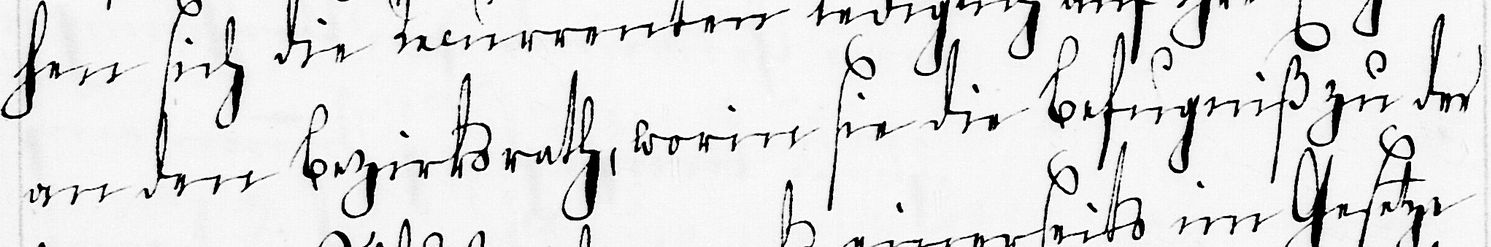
an den Bezirksrath, worin sie die Befugniß zu der
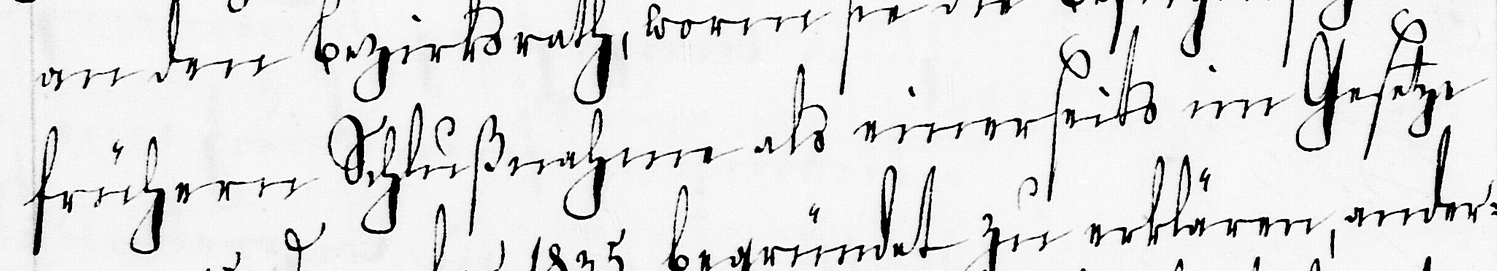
frühern Schlußnahme als einerseits im Gesetze
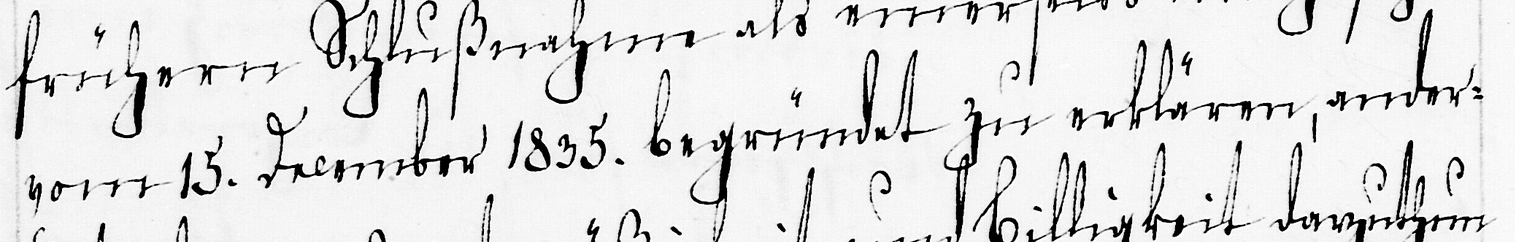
vom 15. December 1835. begründet zu erklären, ander¬
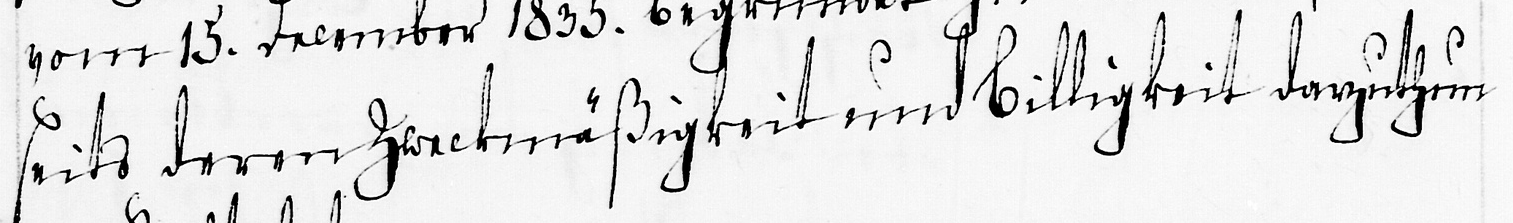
seits deren Zweckmäßigkeit und Billigkeit darzuthun
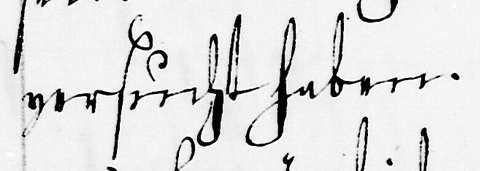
versucht haben.
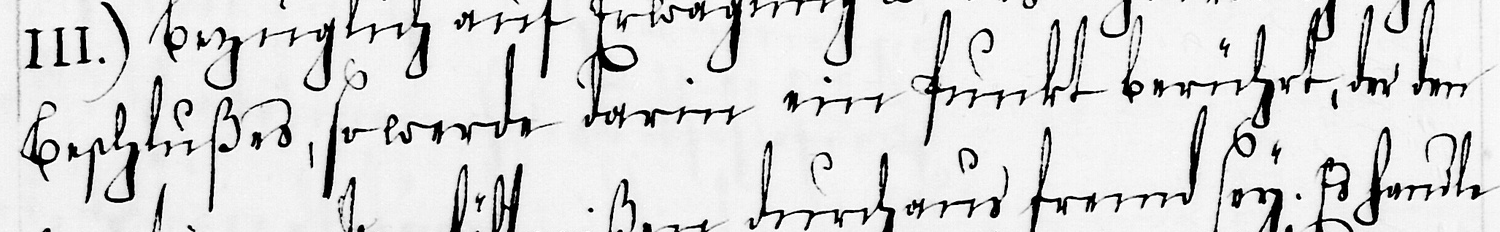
Beschlußes, so werde darin ein Punkt berührt, der den
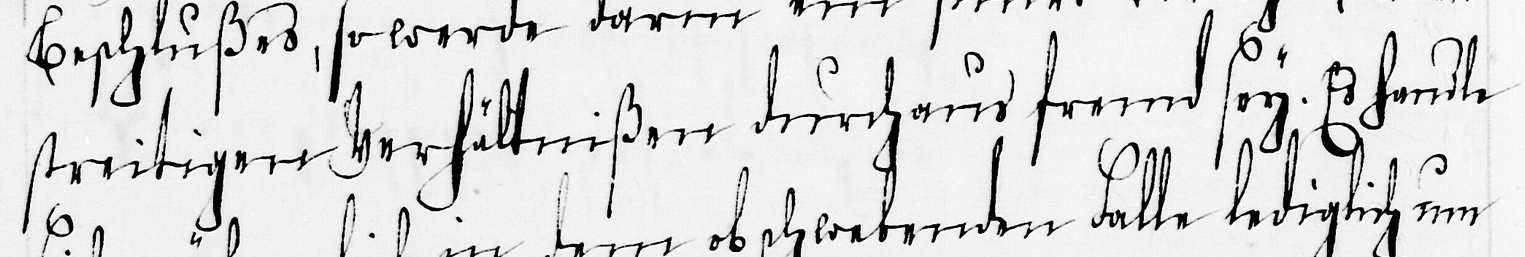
streitigen Verhältnißen durchaus fremd sey. Es handle
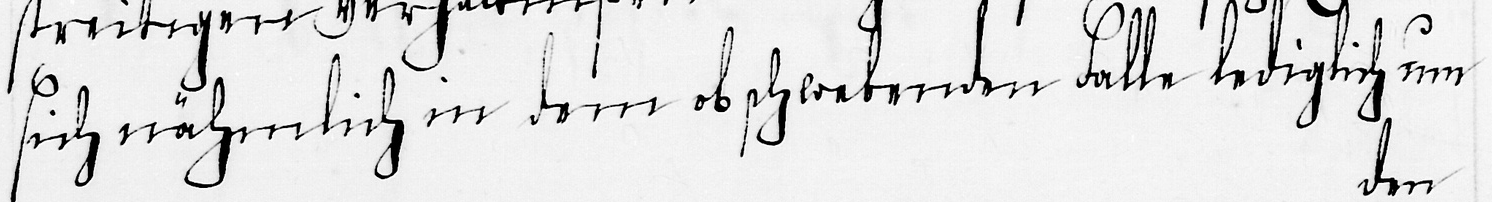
sich nähmlich in dem obschwebenden Falle lediglich um
